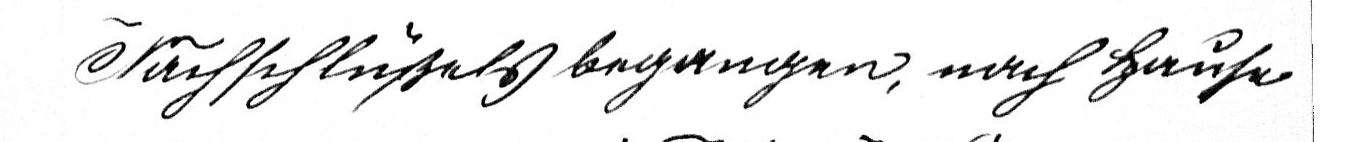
Nachschlüßels begangen, nach Hause
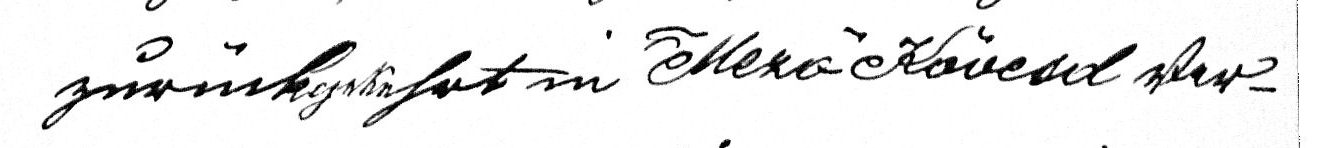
zurück gekehrt in Mezö Kövesd Ver¬
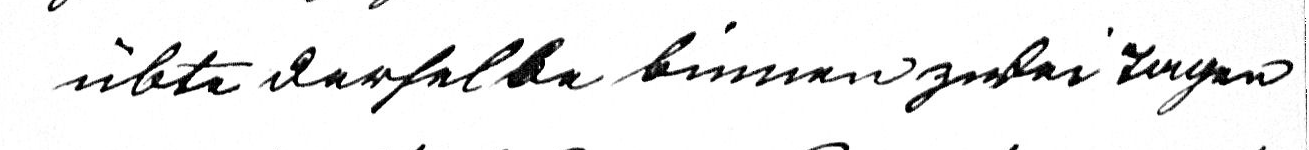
übte derselbe binnen zwei Tagen
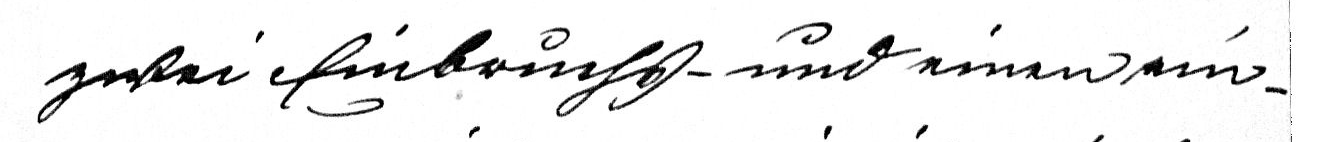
zwei Einbruchs - und einen ein¬
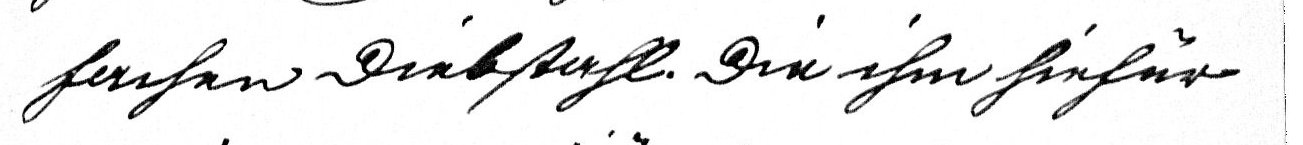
fachen Diebstahl. Die ihm hiefür
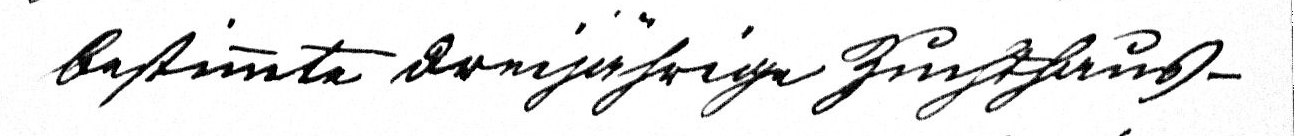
bestimmte dreijährige Zuchthaus¬
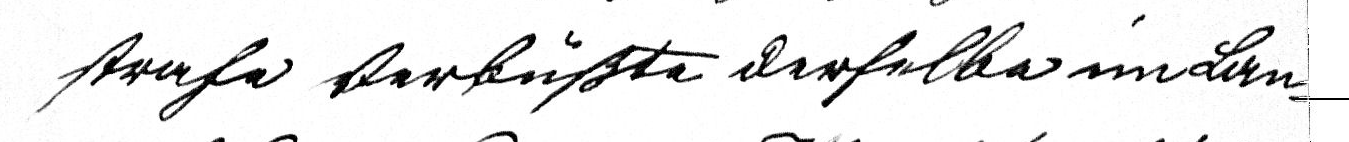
strafe verbüßte derselbe im Lan¬
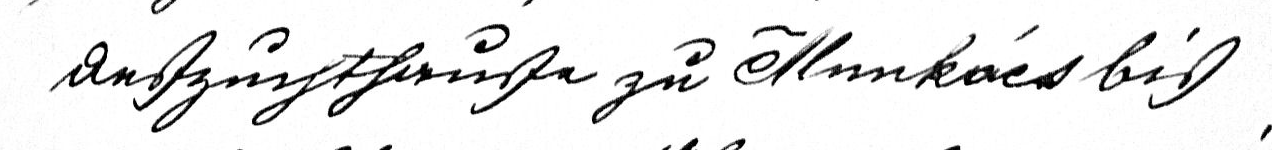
deszuchthause zu Munkócs bis
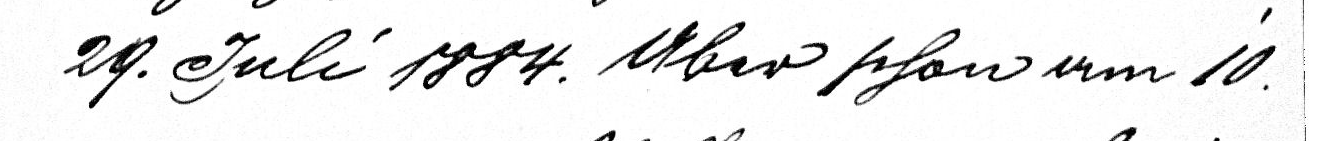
29. Juli 1884. Aber schon am 10.
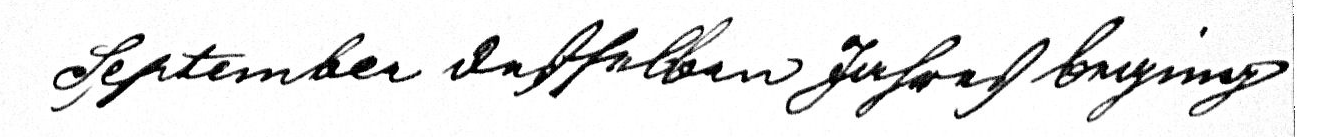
September desselben Jahres beging
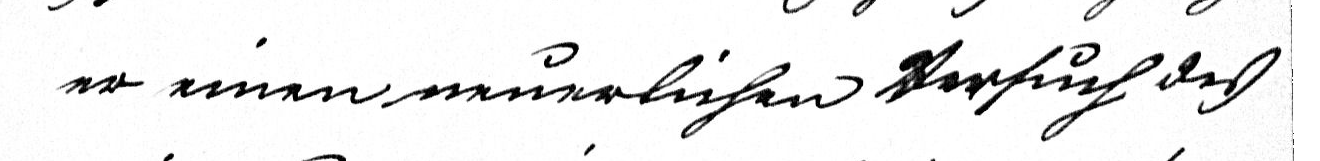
er einen neuerlichen Versuch des
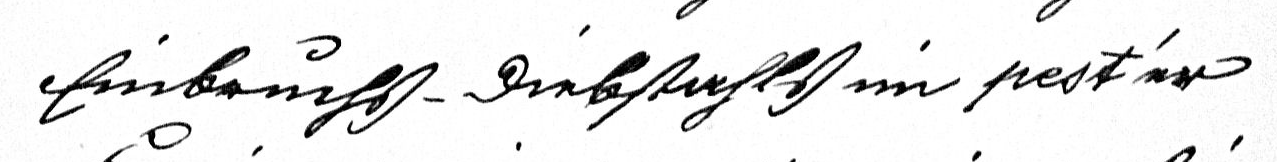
Einbruchs - Diebstahls im pest'er
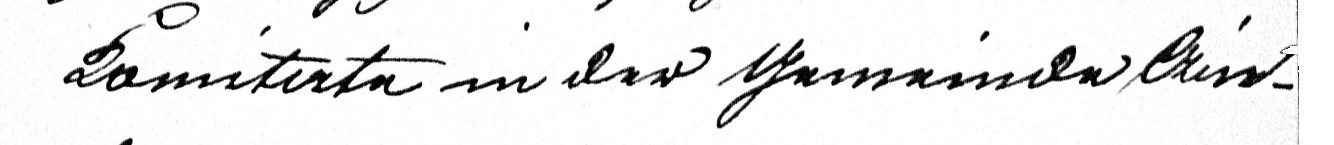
Komitate in der Gemeinde Czin¬
